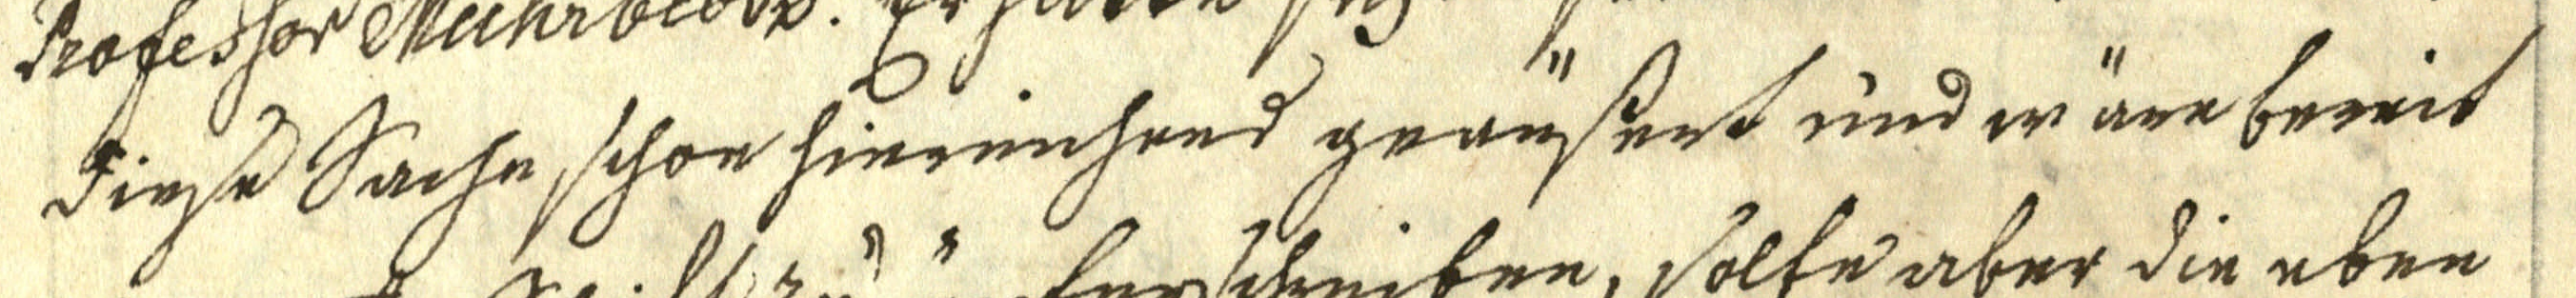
diese Sache schon hinreichend geäußert und wäre bereit
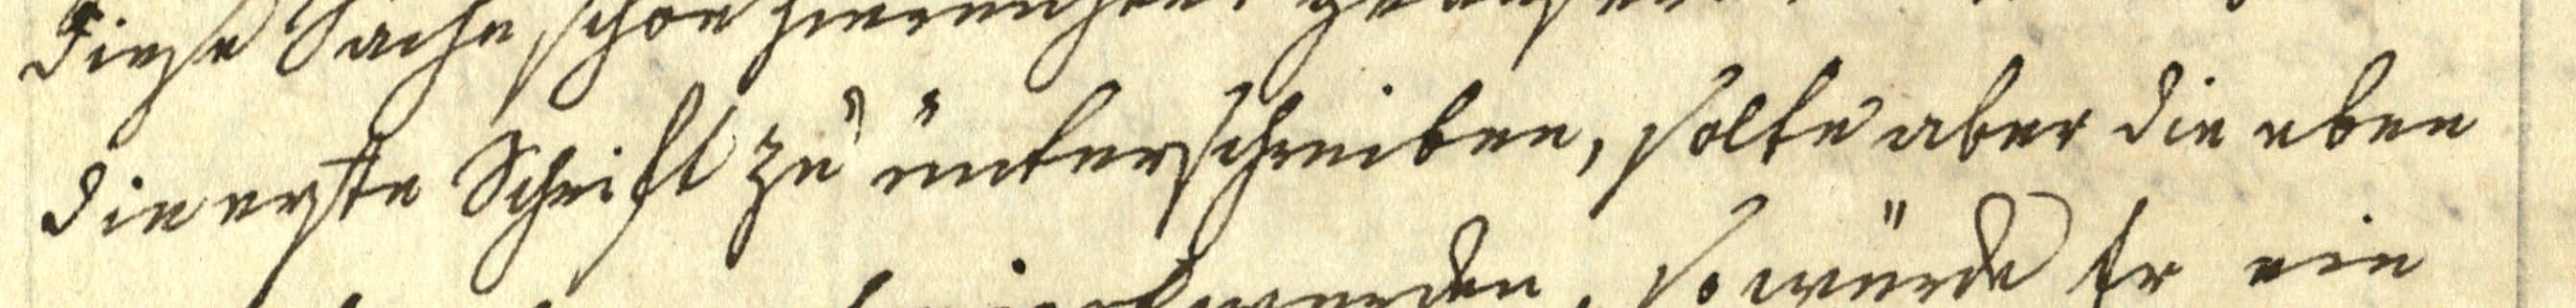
die erste Schrift zu unterschreiben, solte aber die eben
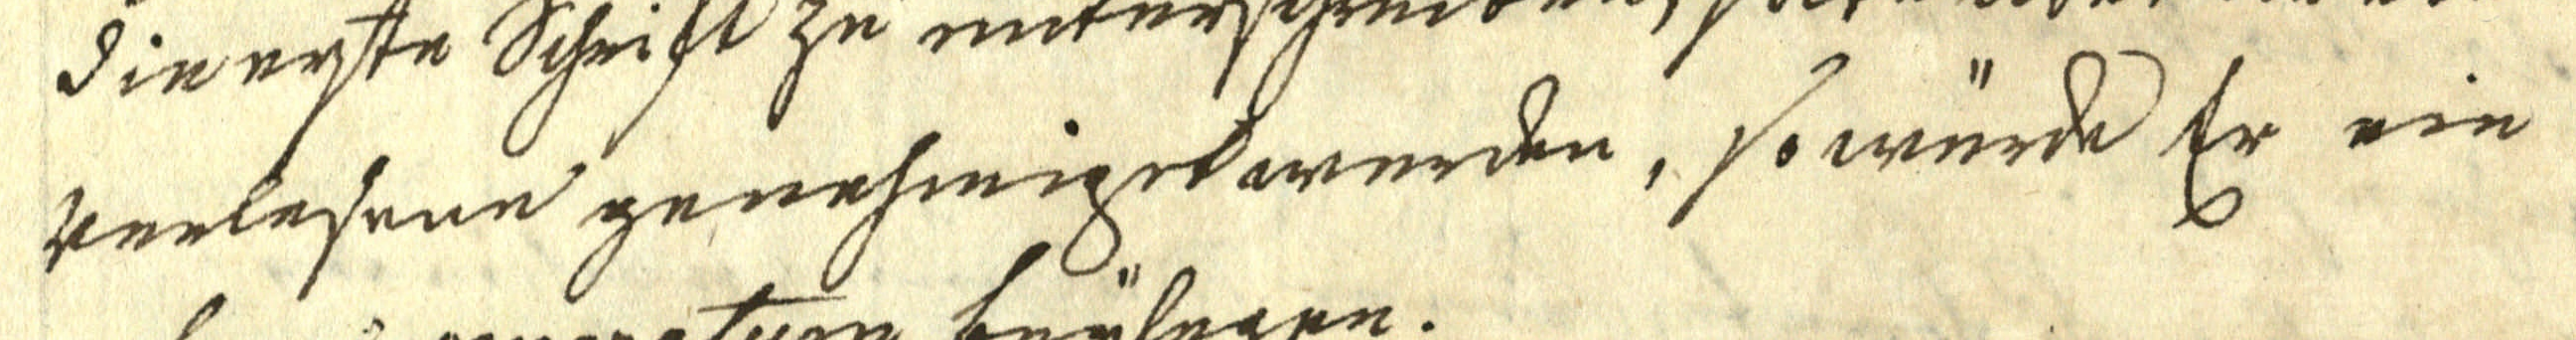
verlesene genehmiget werden, so würde Er ein
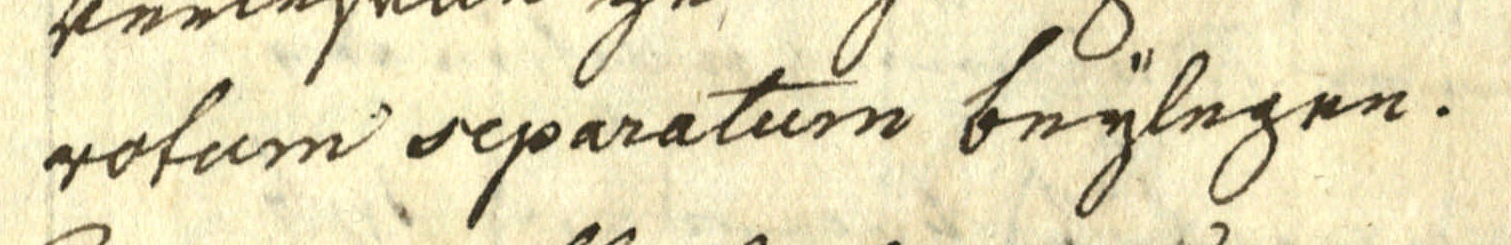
votum separatum beÿlegen.
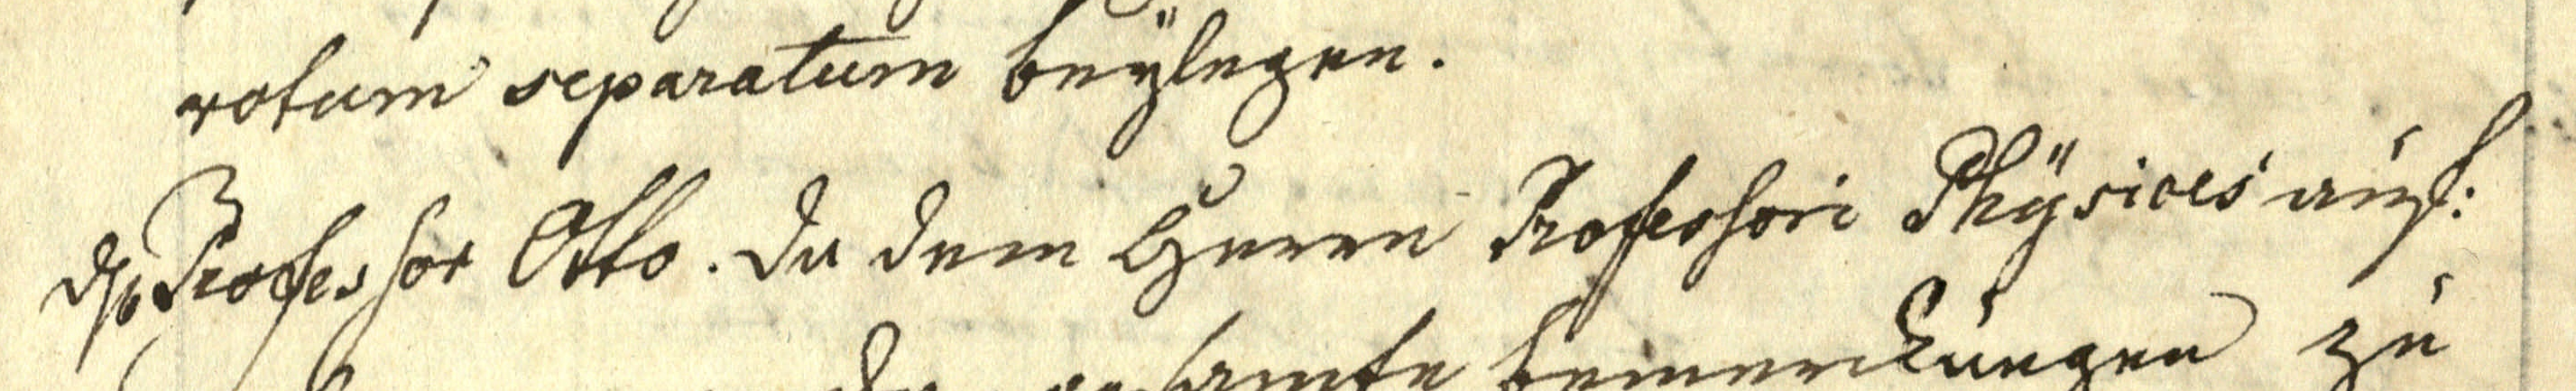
dh Professor Otto. Da dem Herrn Professori Phÿsices auf
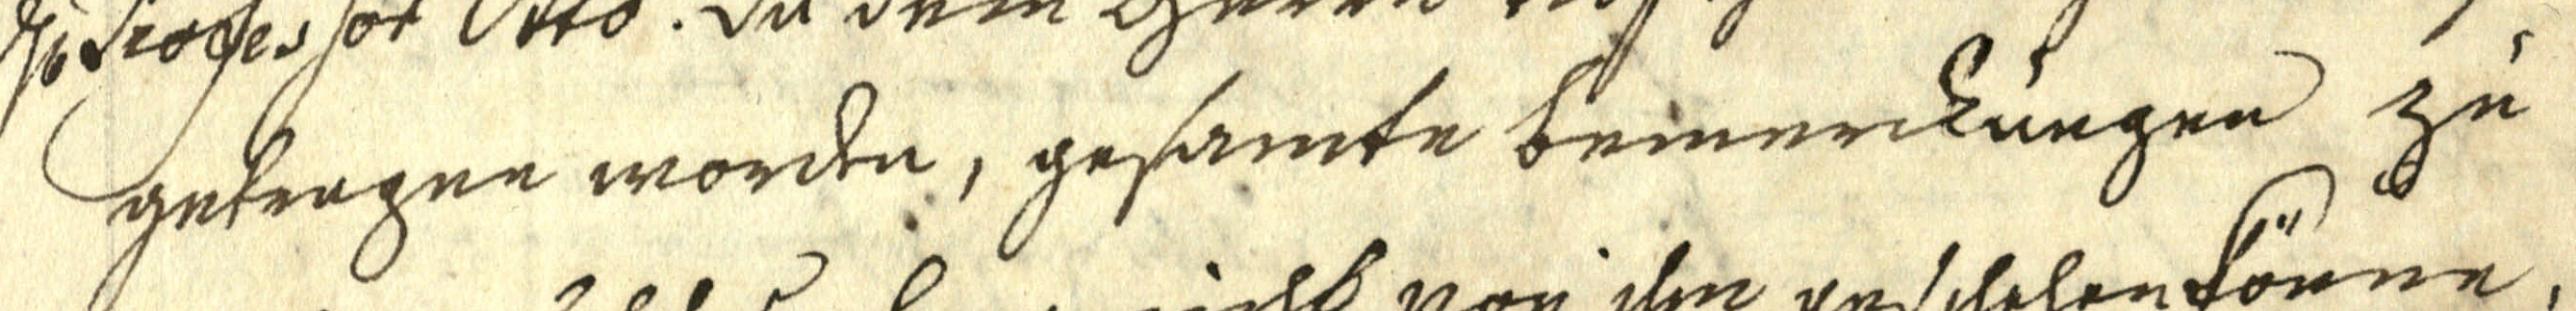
getragen worden, gesamte Bemerckungen zu
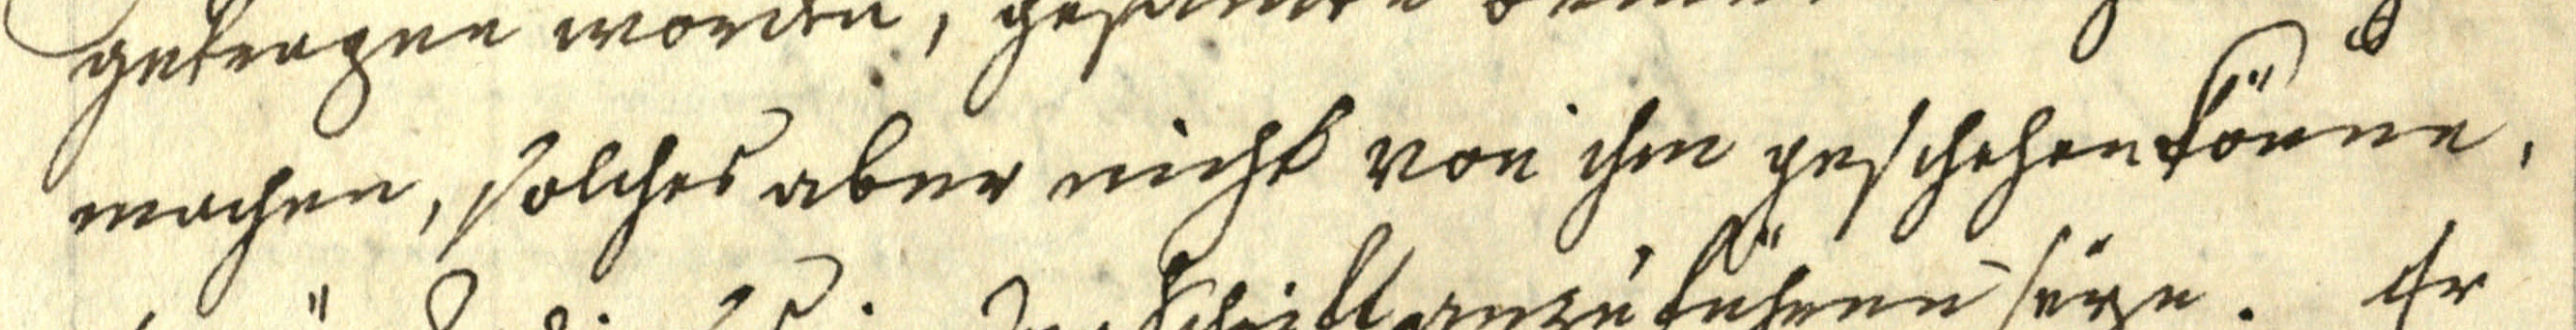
machen, solches aber nicht von ihm geschehen könne,
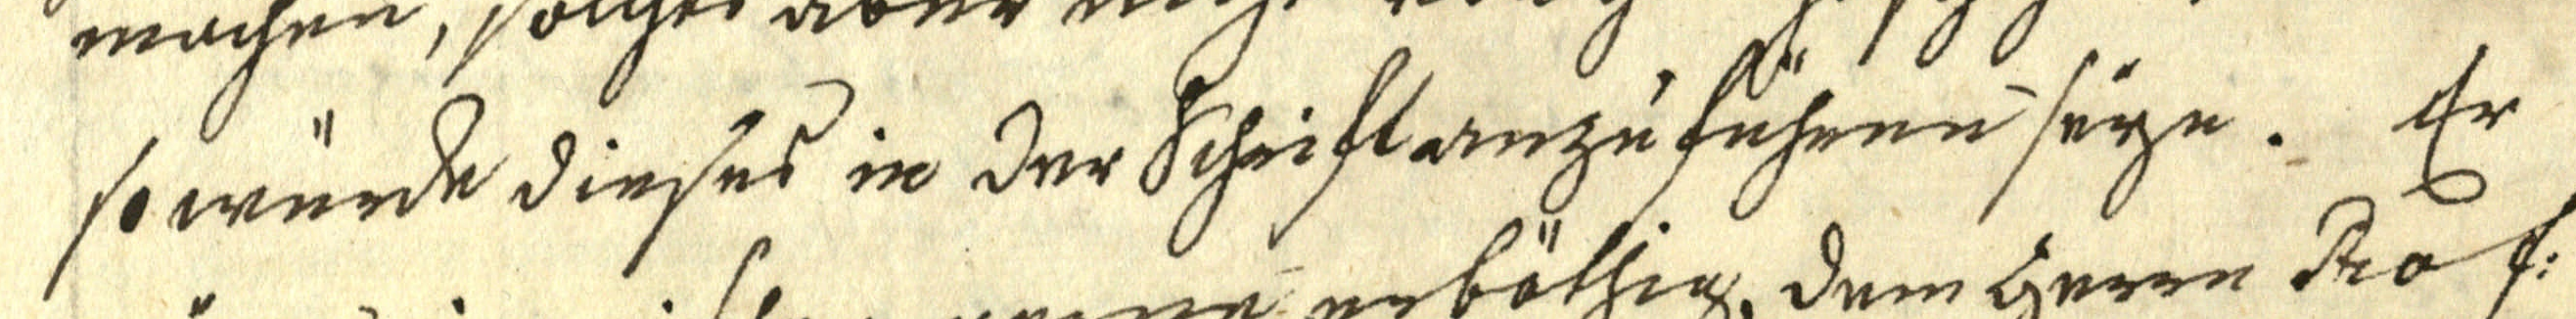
so würde dieses in der Schrift anzuführen seÿn. Er
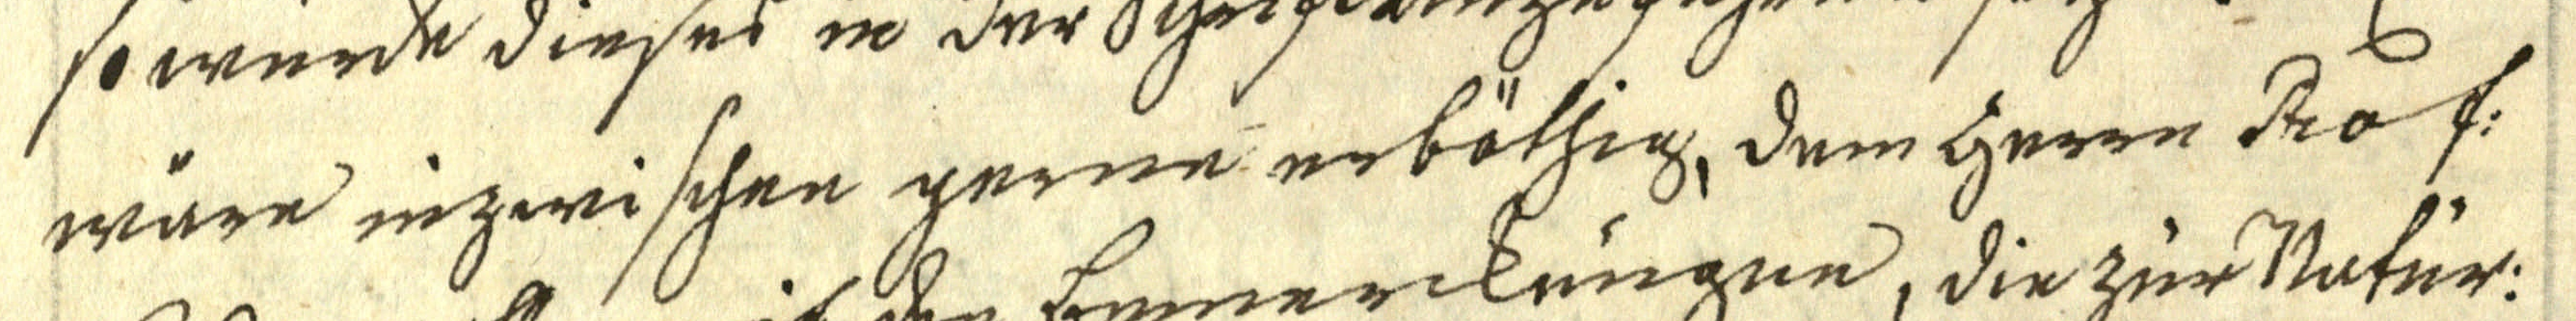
wäre inzwischen gerne erböthig, dem Herrn Prof.
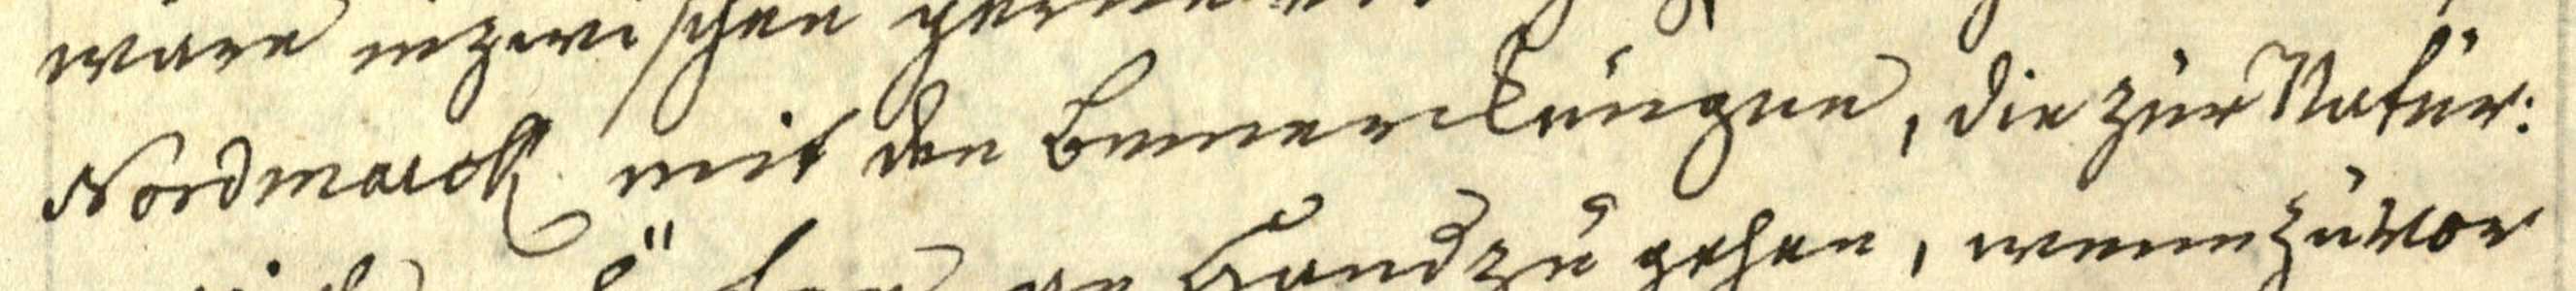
Nordmarck mit den Bemerckungen, die zur Natur¬
